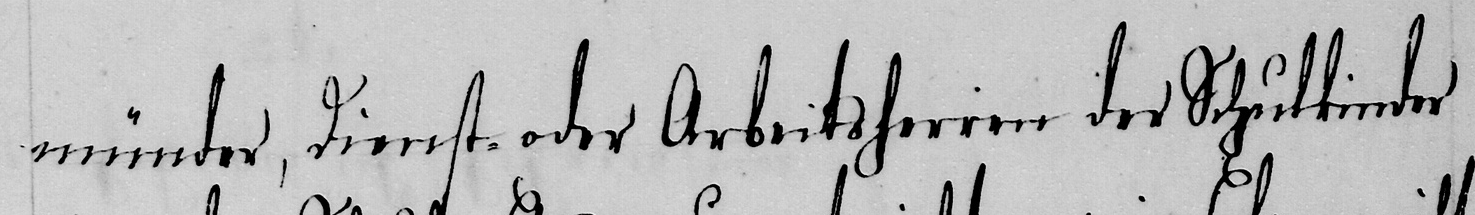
münder, Dienst- oder Arbeitsherren der Schulkinder
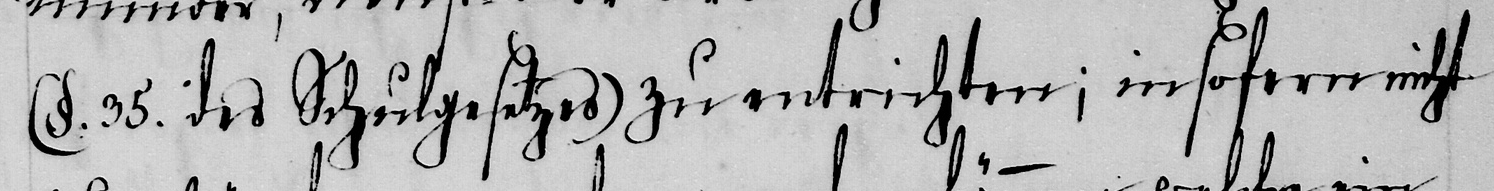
(§. 35. des Schulgesetzes) zu entrichten; insofern nicht
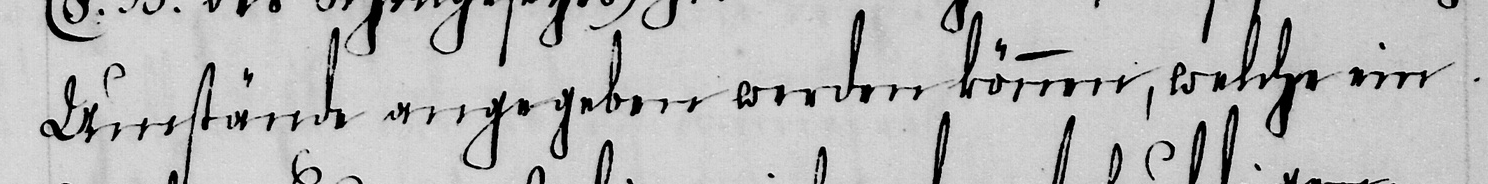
Umstände angegeben werden könne, welche ein
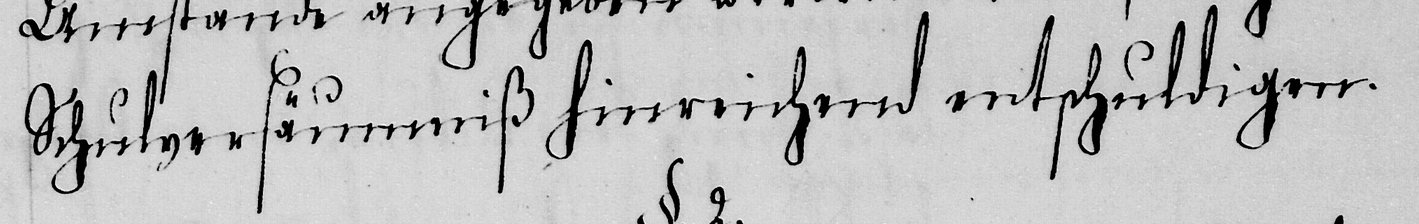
Schulversäumniß hinreichend entschuldigen.
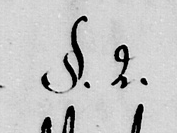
§. 2.
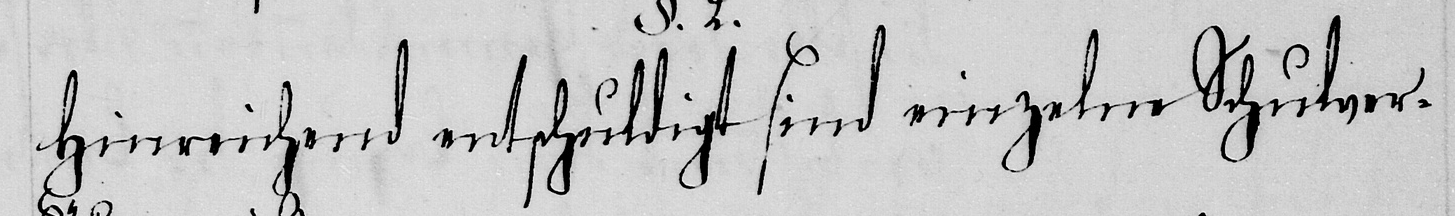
Hinreichend entschuldigt sind einzelne Schulver¬
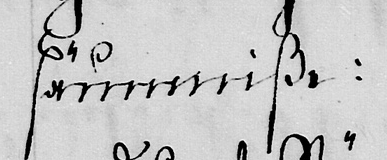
säumniße:
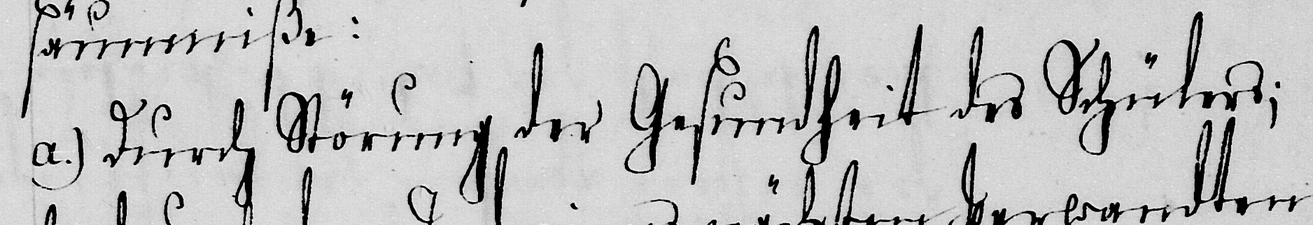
a.) Durch Störung der Gesundheit des Schülers;
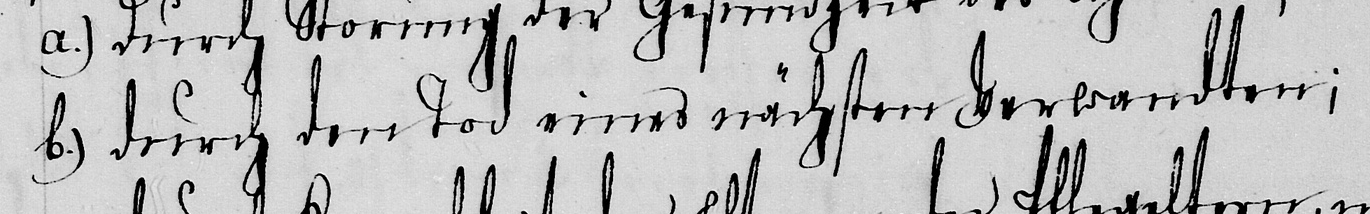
b.) durch den Tod eines nächsten Verwandten;
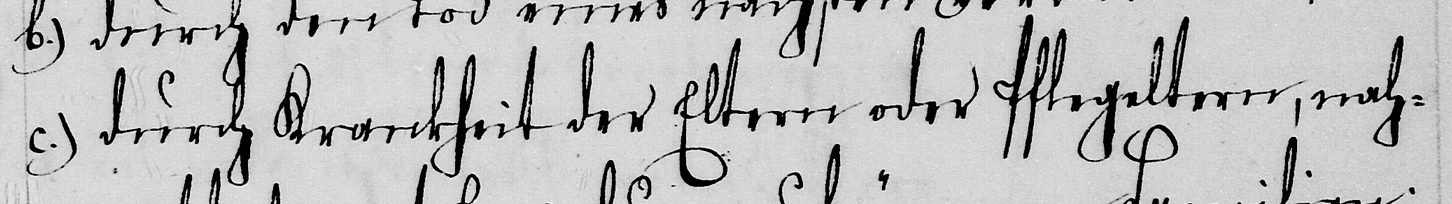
c.) durch Krankheit der Eltern oder Pflegeltern, nah¬
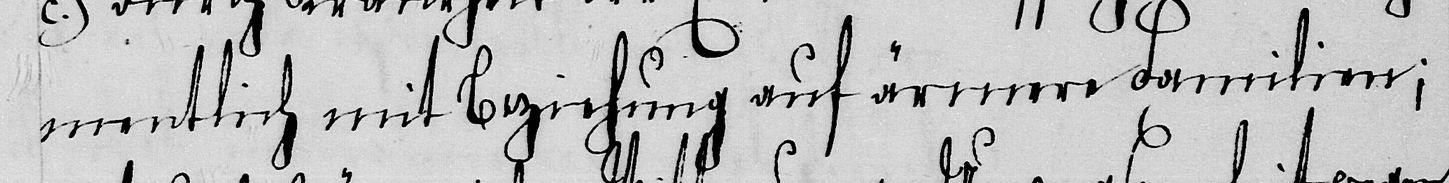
mentlich mit Beziehung auf ärmere Familien;
